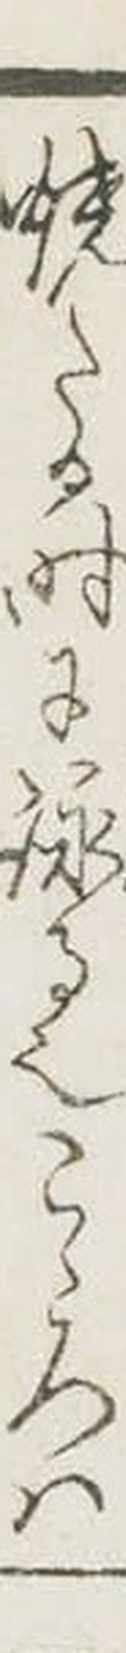焼たる時に詠る也こゝろは
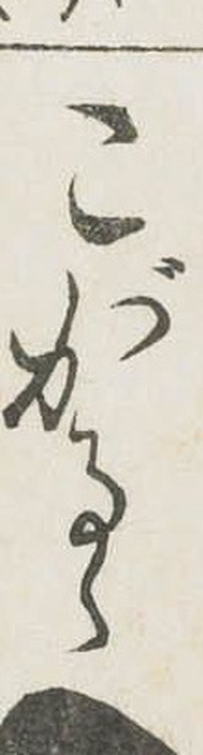こがるゝ
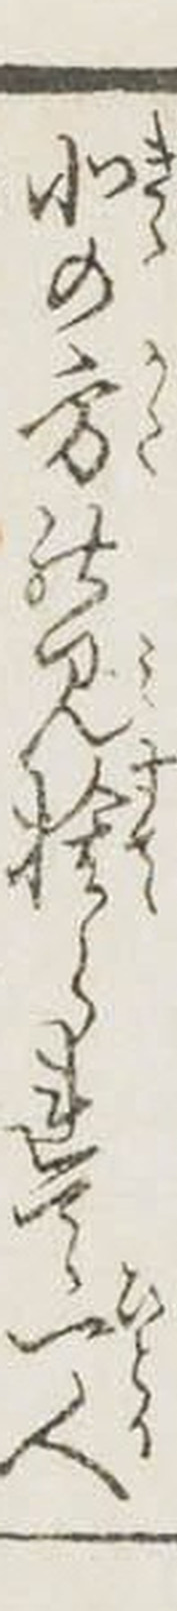北の方の見捨られて一人
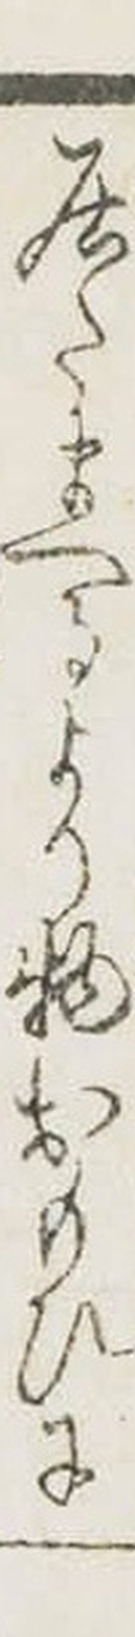居たまへるより物おもひに
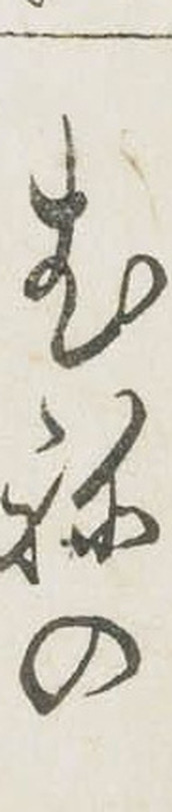むねの
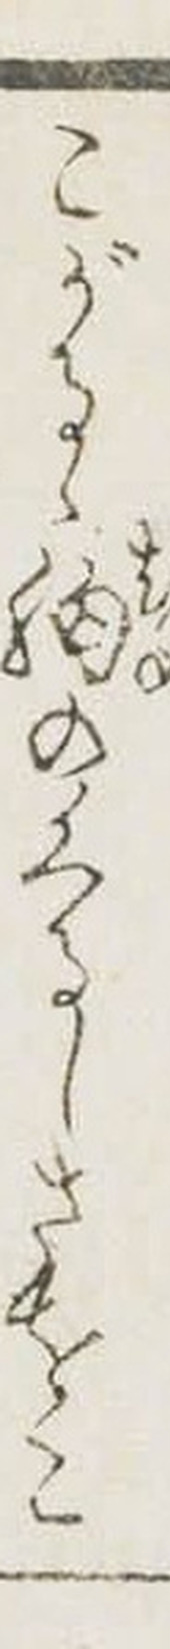こがるゝ胸のくるしさをこ
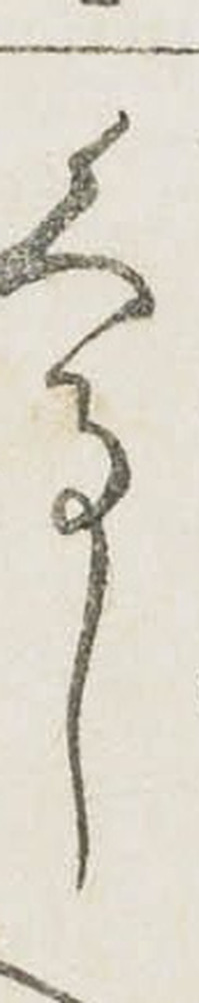くるし
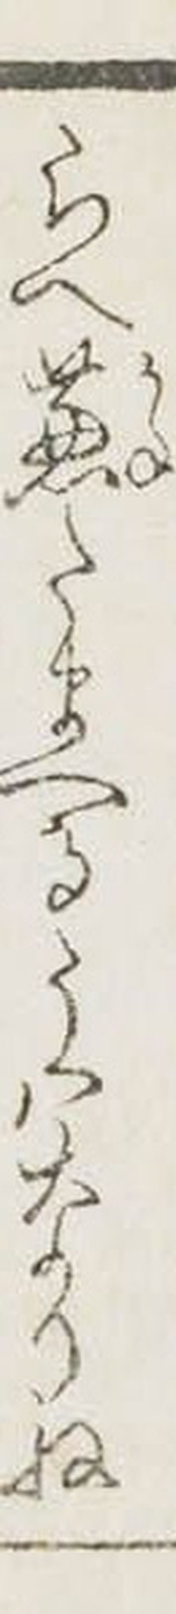らへ兼たまへるうはなりんね
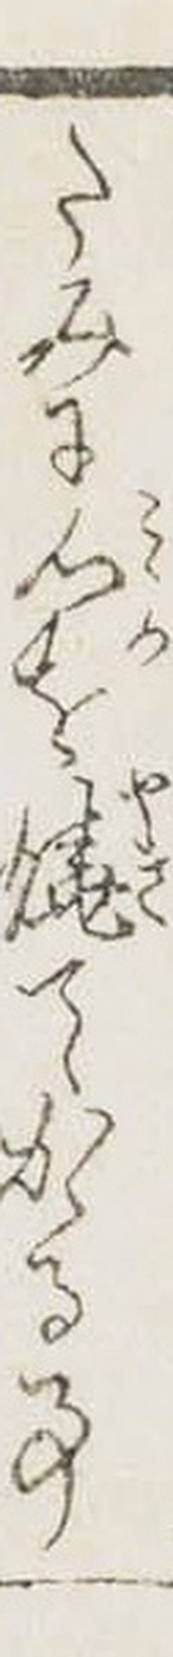たみに心を焼てかゝる事
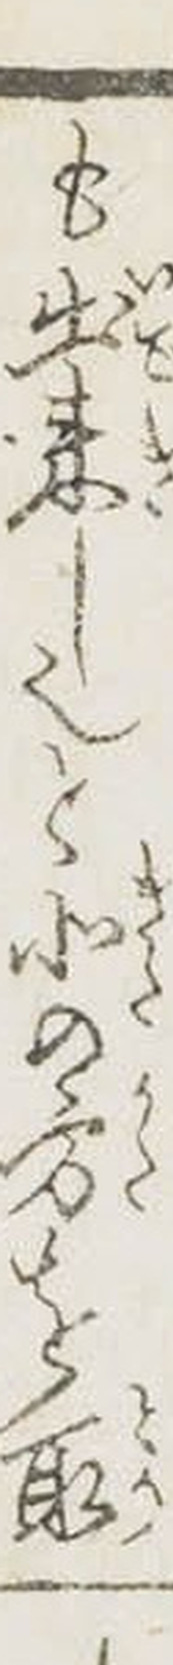も出来し也と北の方を取
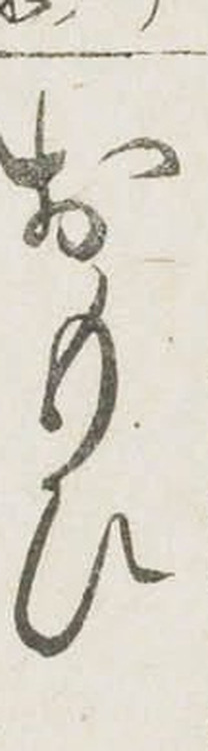おもひ
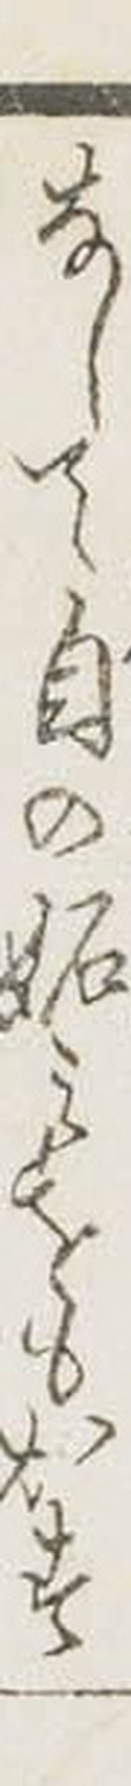なして自の妬みをもかす
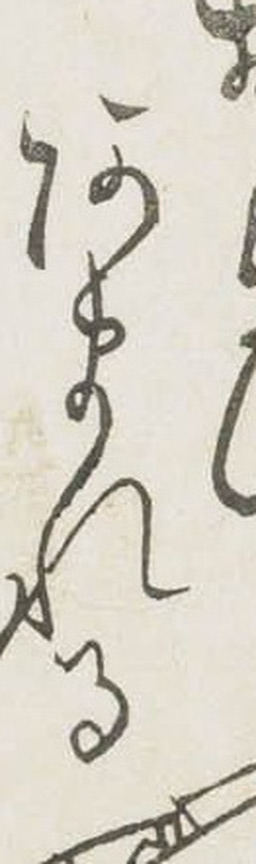あまれる
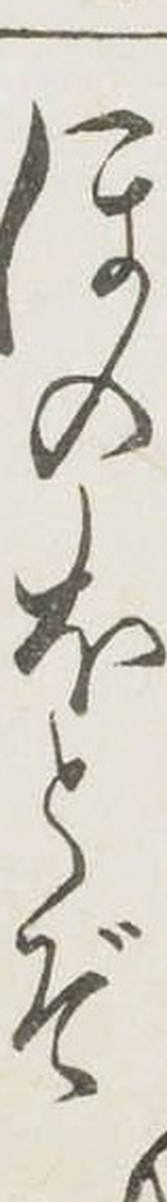ほのほとぞ
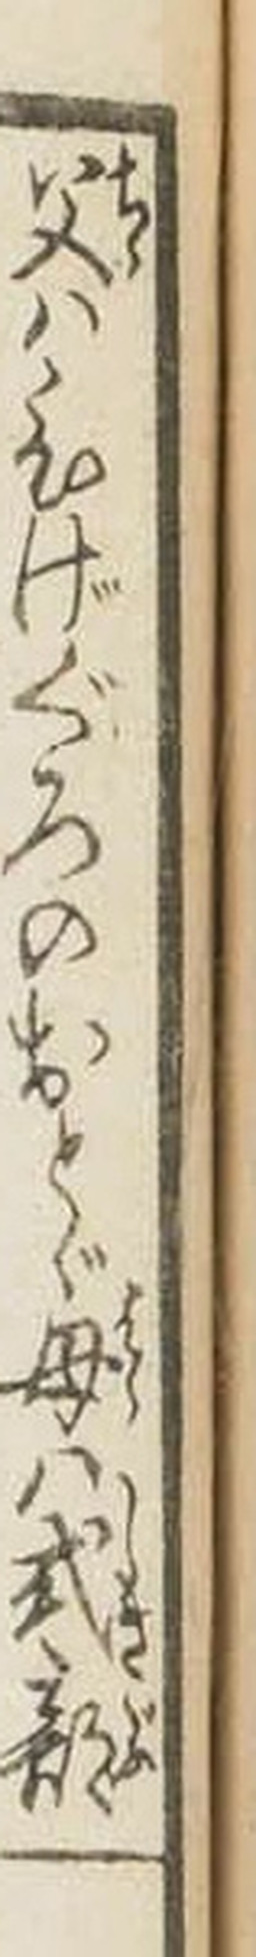父はひげぐろのおとゞ母は式部
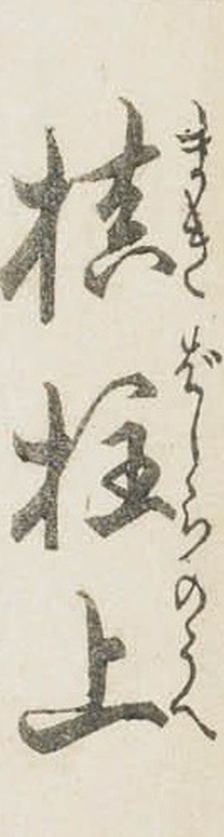槙柱上
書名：源氏百人一首
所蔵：東京学芸大学教育コンテンツアーカイブ
